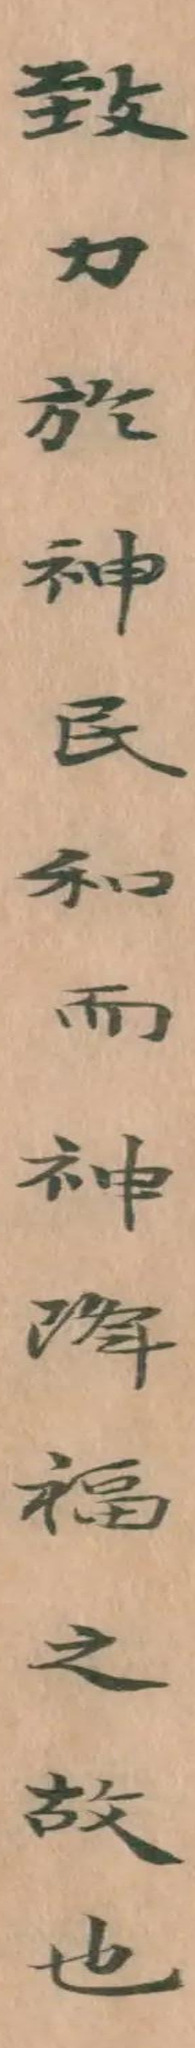致力於神民和而神降福之故也
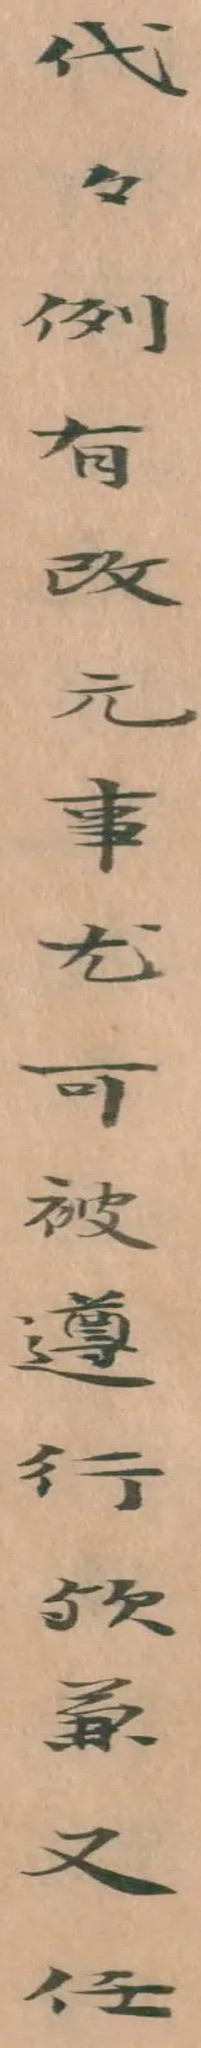代々例有改元事尤可被遵行歟兼又任
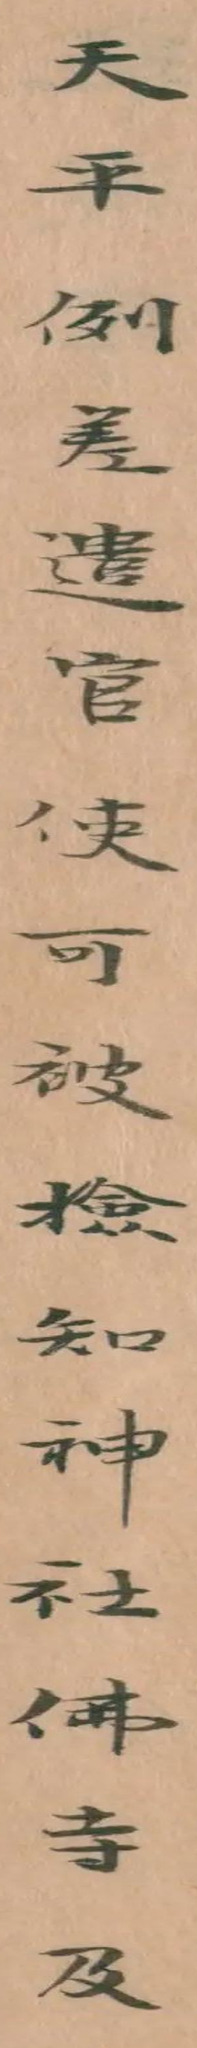天平例差遣官使可被検知神社仏寺及
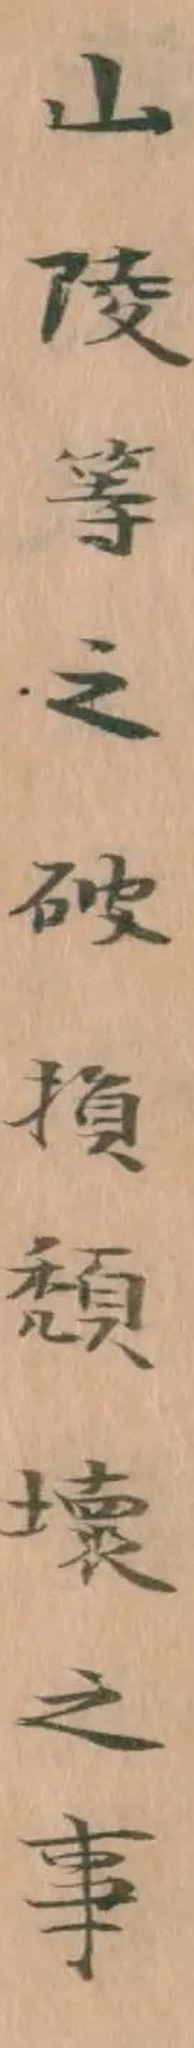山陵等之破損頽壊之事
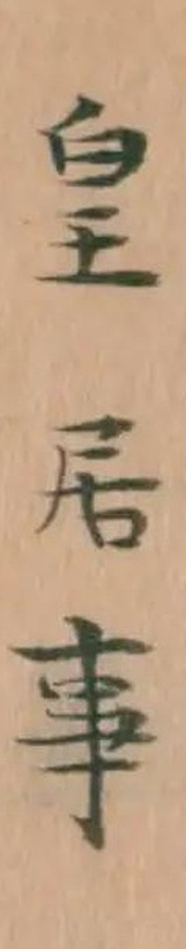皇居事
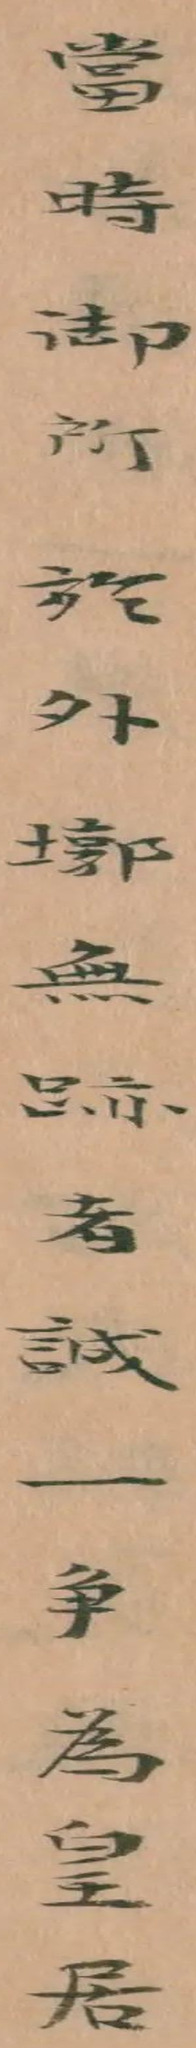当時御所於外郭無跡者誠一争為皇居
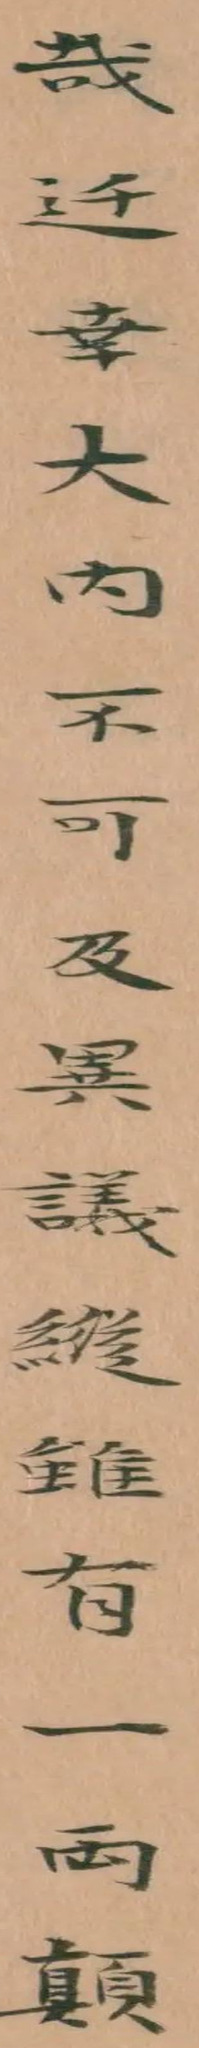哉遷幸大内不可及異議縦雖有一両顛
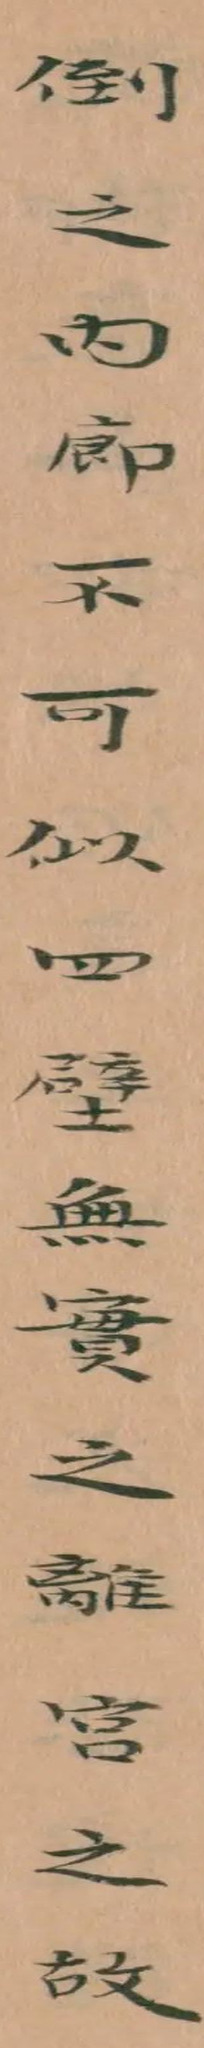倒之内廊不可似四壁無実之離宮之故
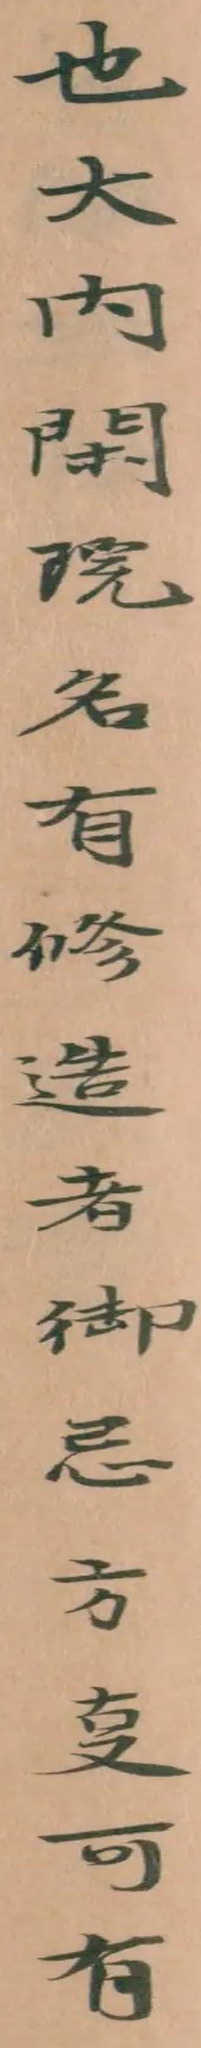也大内閑院名有修造者御忌方事可有
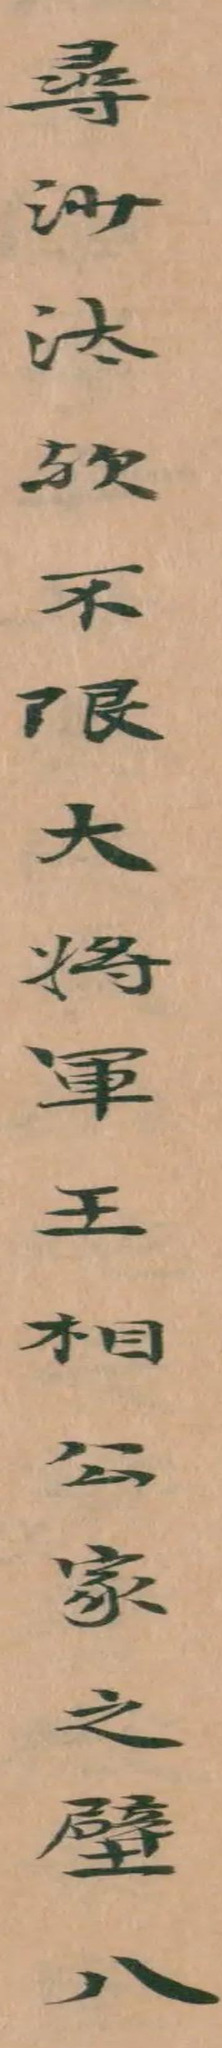尋沙汰歟不限大将軍王相公家之壁八
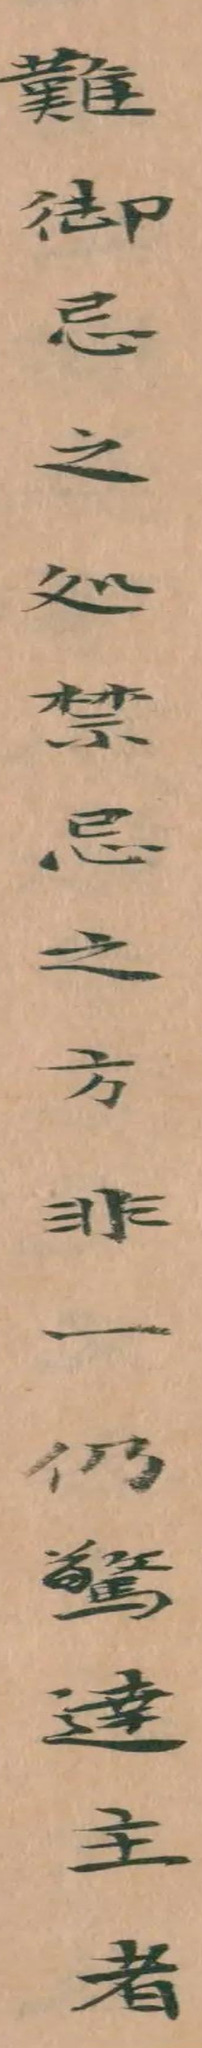難御忌之処禁忌之方非一仍驚達主者
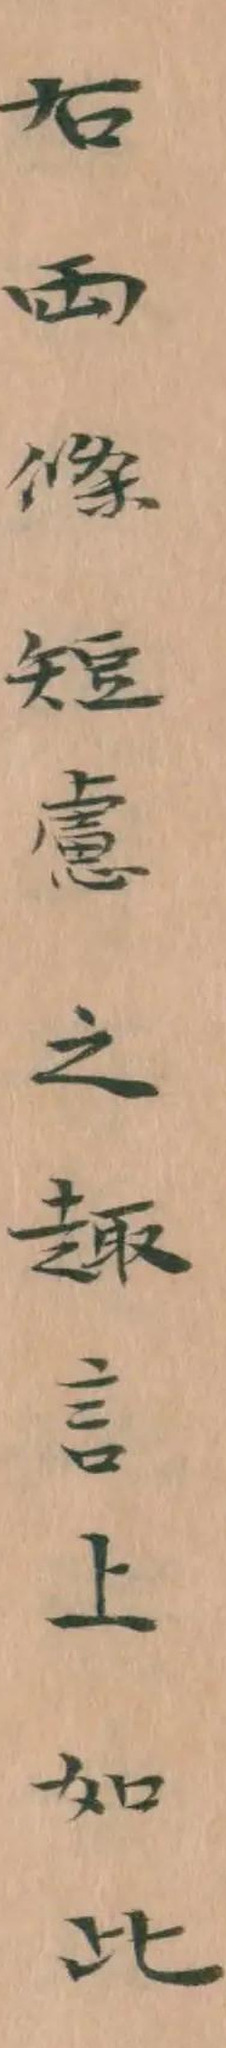右両条短慮之趣言上如此
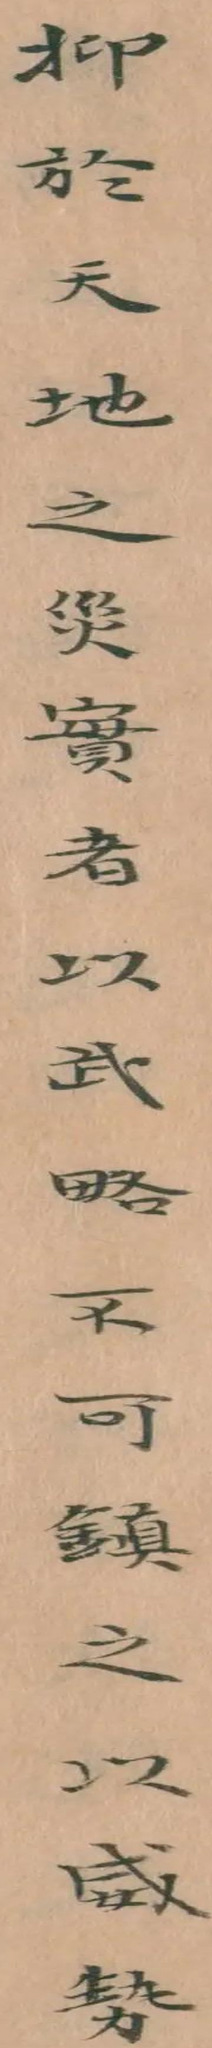抑於天地之災実者以武略不可鎮之以威勢
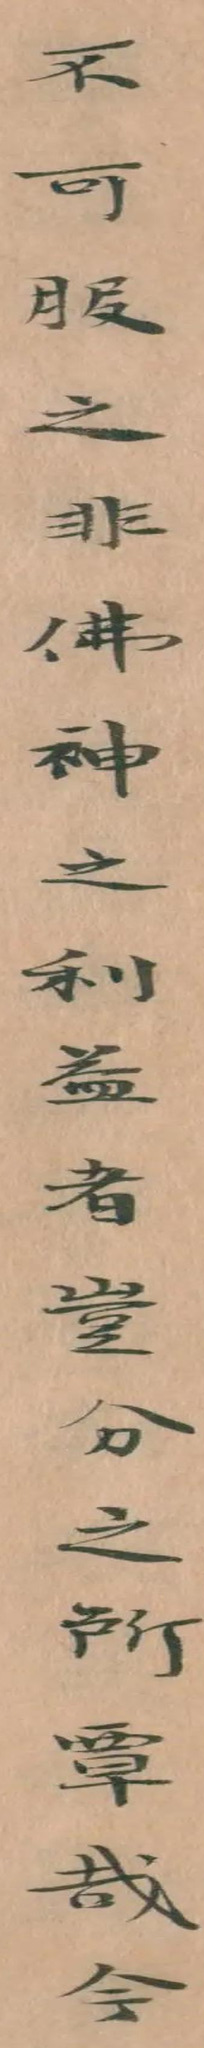不可服之非仏神之利益者豈分之所覃哉今
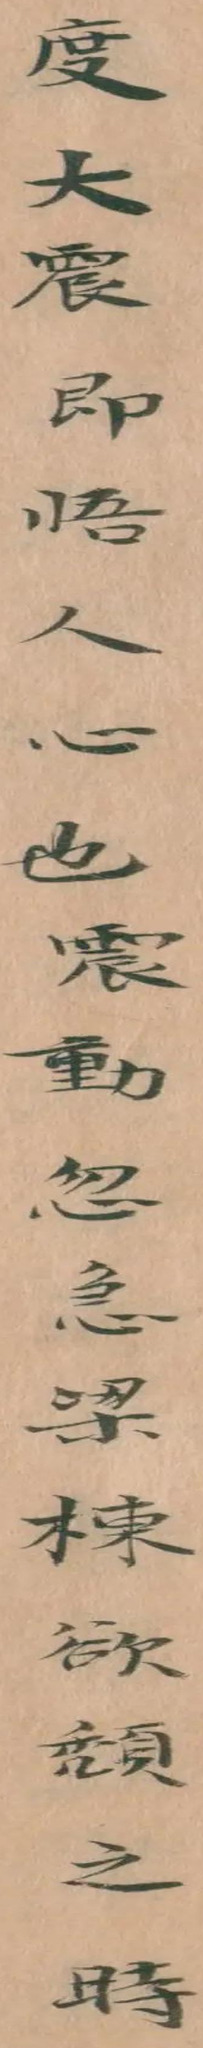度大震即悟人心也震動忽急梁棟欲頽之時
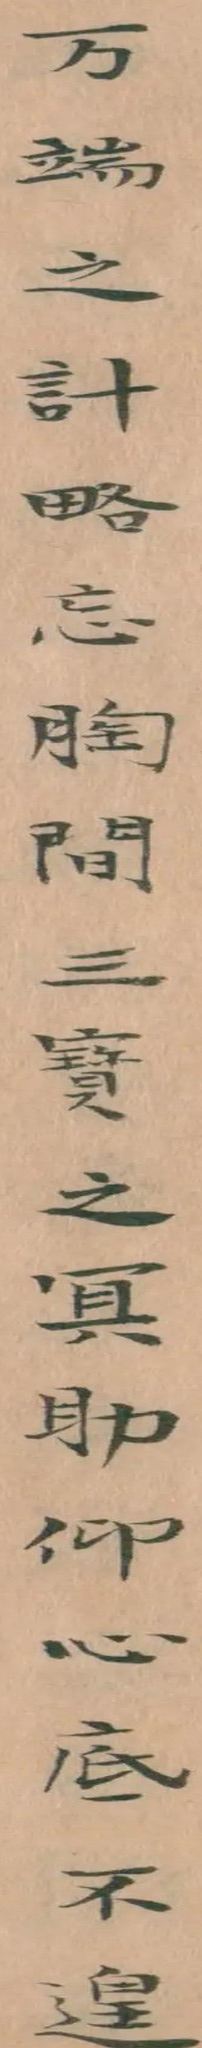万端之計略忘胸間三宝之冥助仰心底不遑
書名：地災撮要. 巻5-6(地震之部)
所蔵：国立国会図書館 National Diet Library, JAPAN
